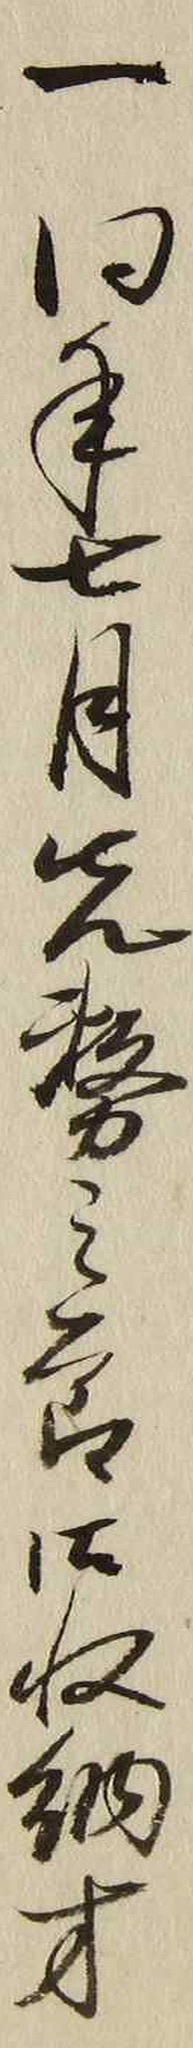一同年七月先務之節御収納方
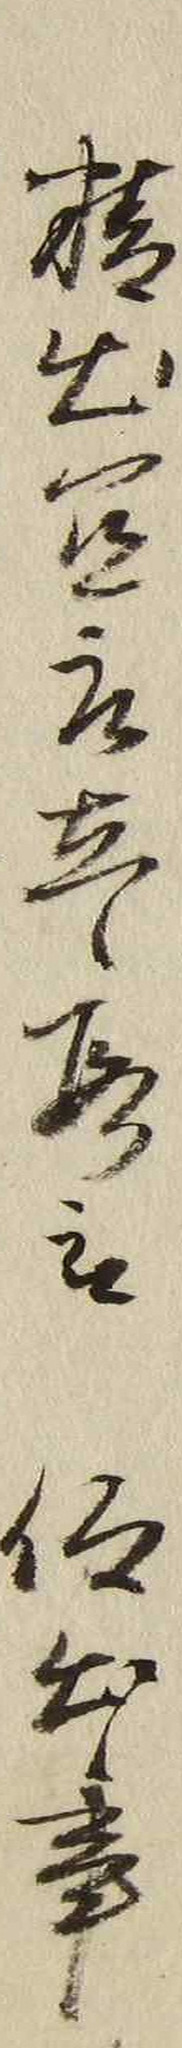精出宜取立候段被仰出候事
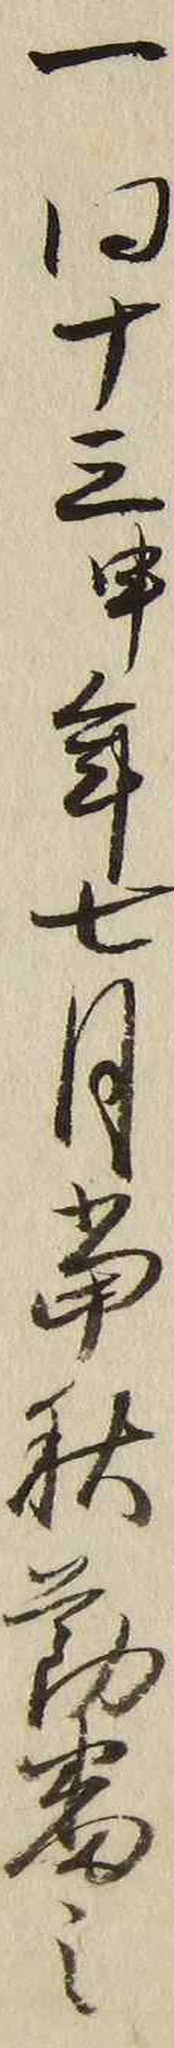一同十三申年七月当秋勤番之

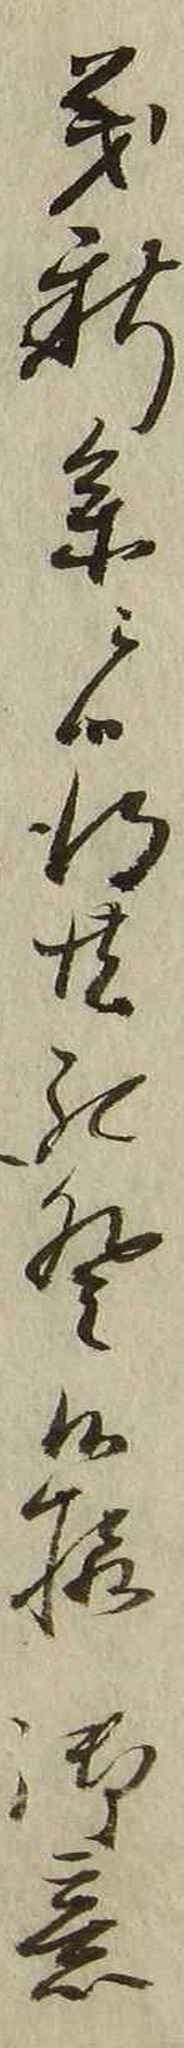義新参ニ候得共罷登候様御意
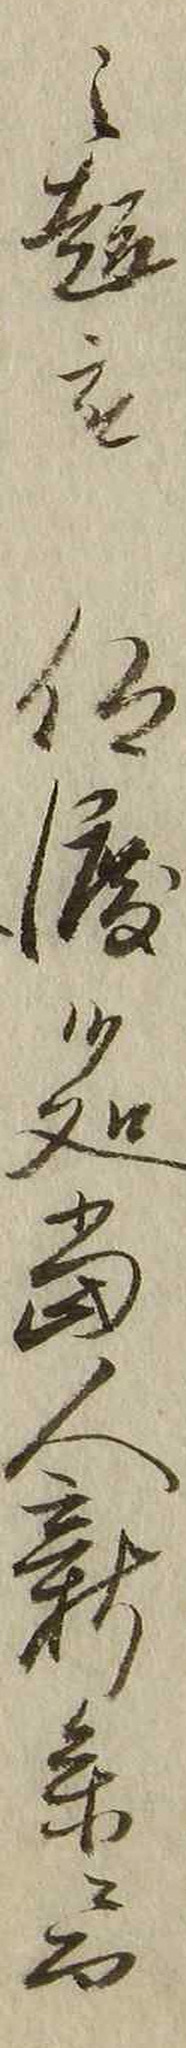之趣被仰渡候処当人新参ニ而
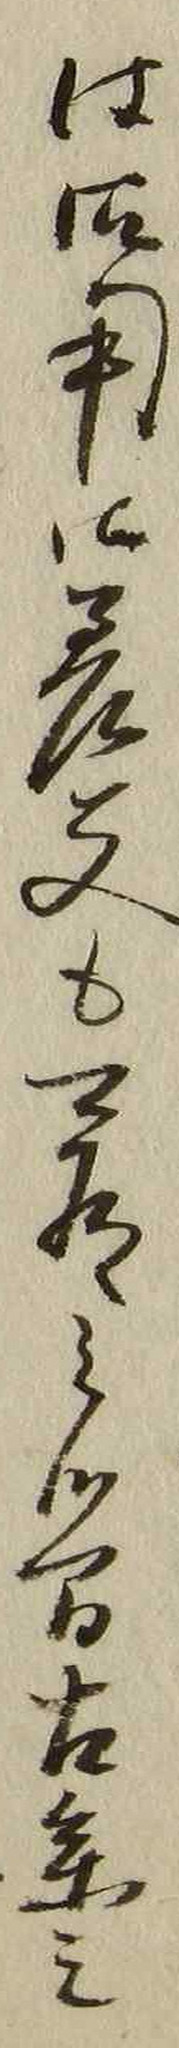は御用御差支も可有之候間古参之
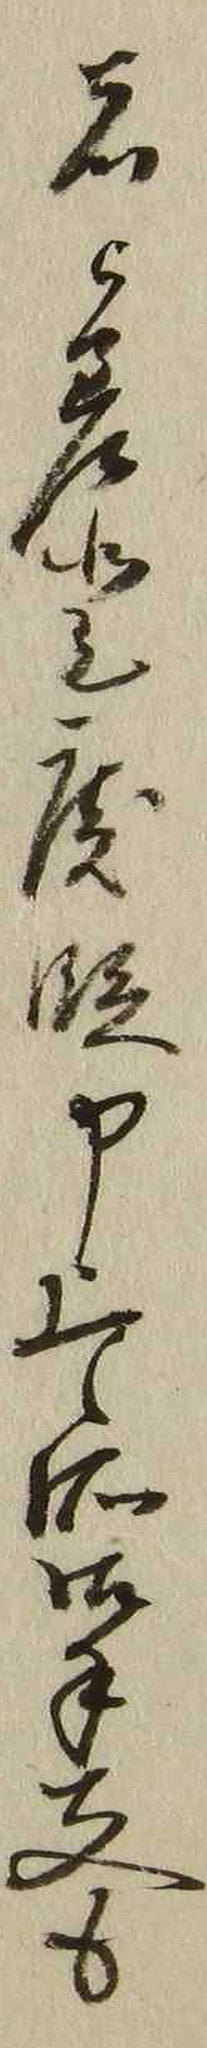者被差登度段申上候所御手支も
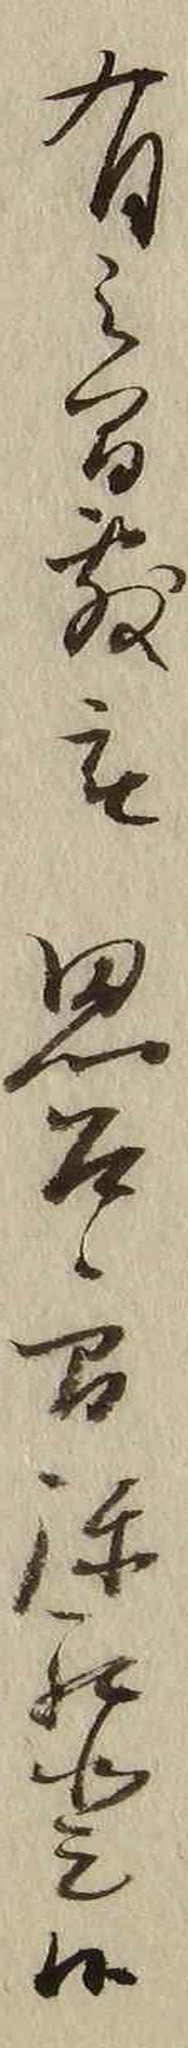有之間敷被思召候間弥罷登候
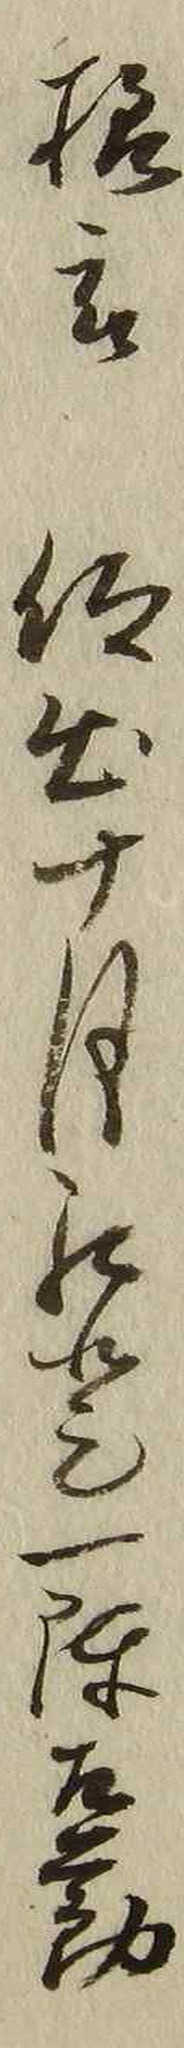様被仰出十月罷登一陣相勤
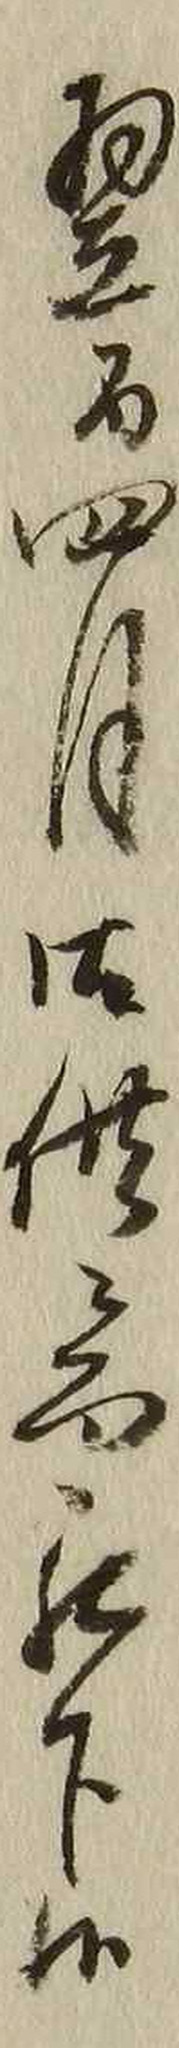翌酉四月御供ニ而罷下候
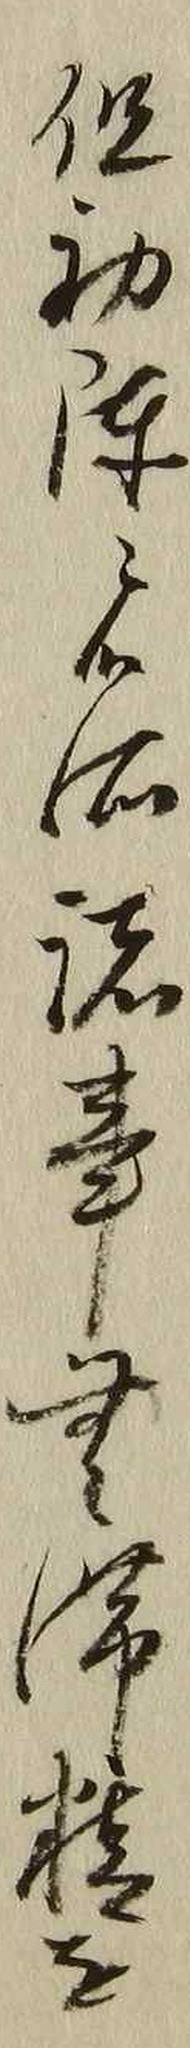但初陣ニ候所諸事無滞精を
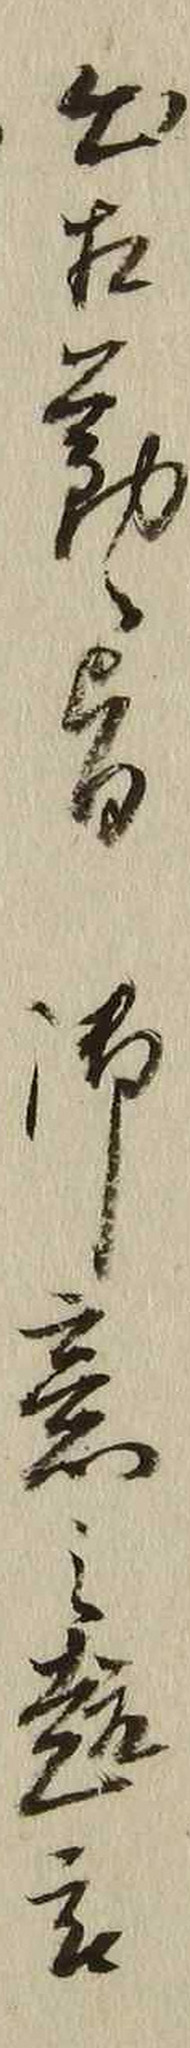出相勤候旨御意之趣被
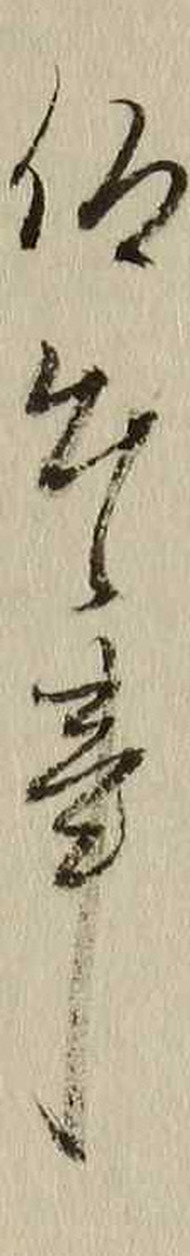仰出候事
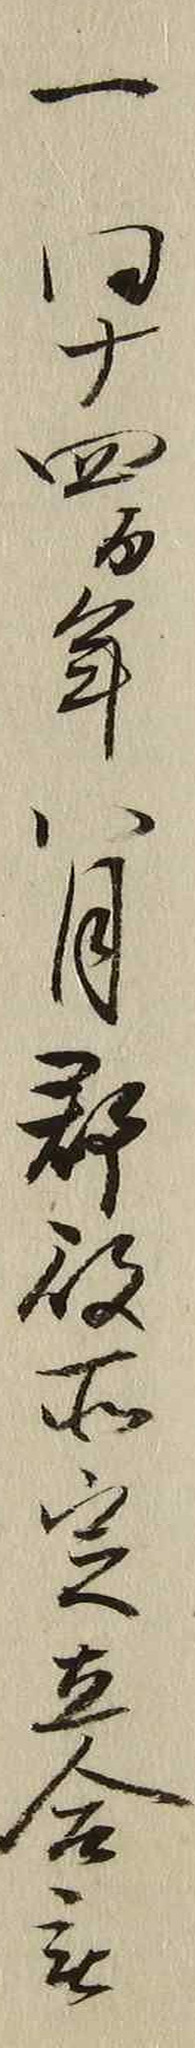一同十四酉年八月郡役所定立合被
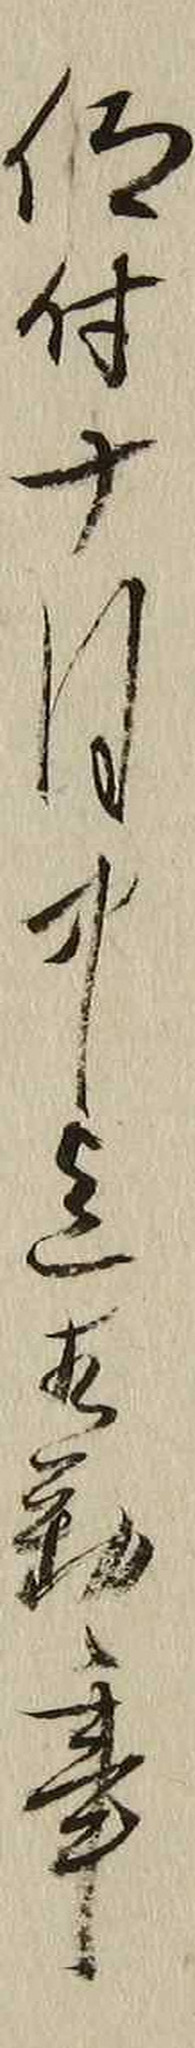仰付十月中迄相勤候事
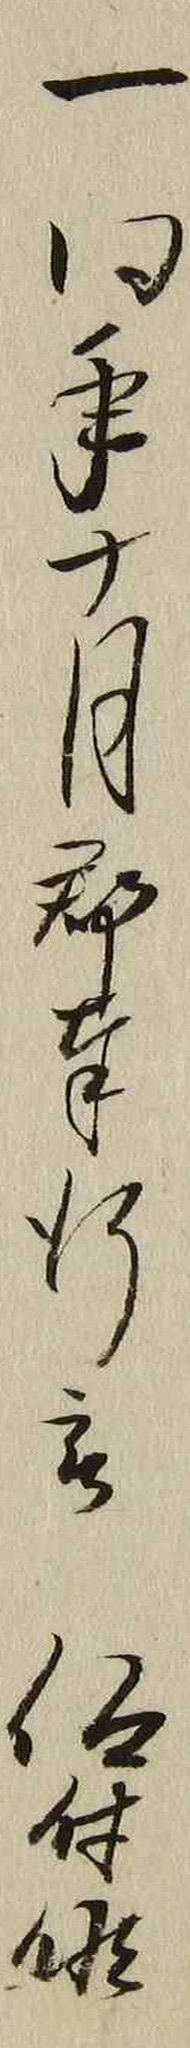一同年十月郡奉行被仰付候
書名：諸士系譜　巻之352　す之部2
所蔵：会津若松市立会津図書館
